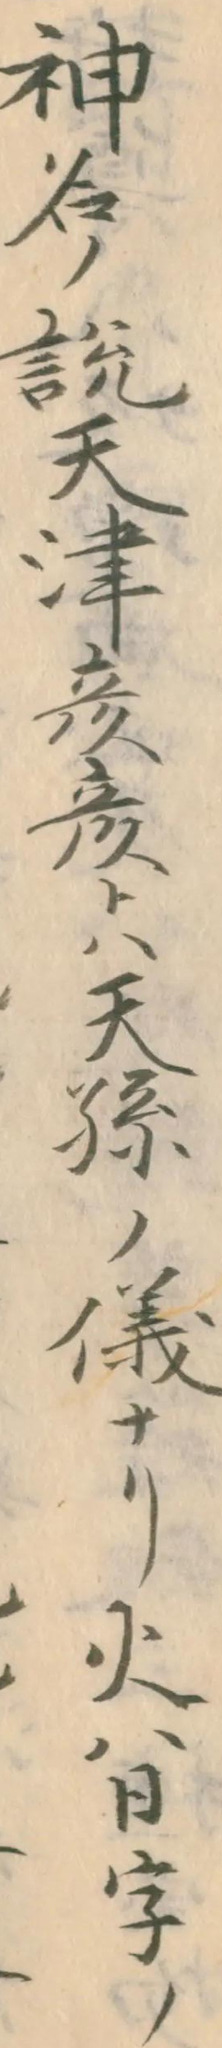神名ノ説天津彦彦トハ天孫ノ儀ナリ火ハ日字ノ
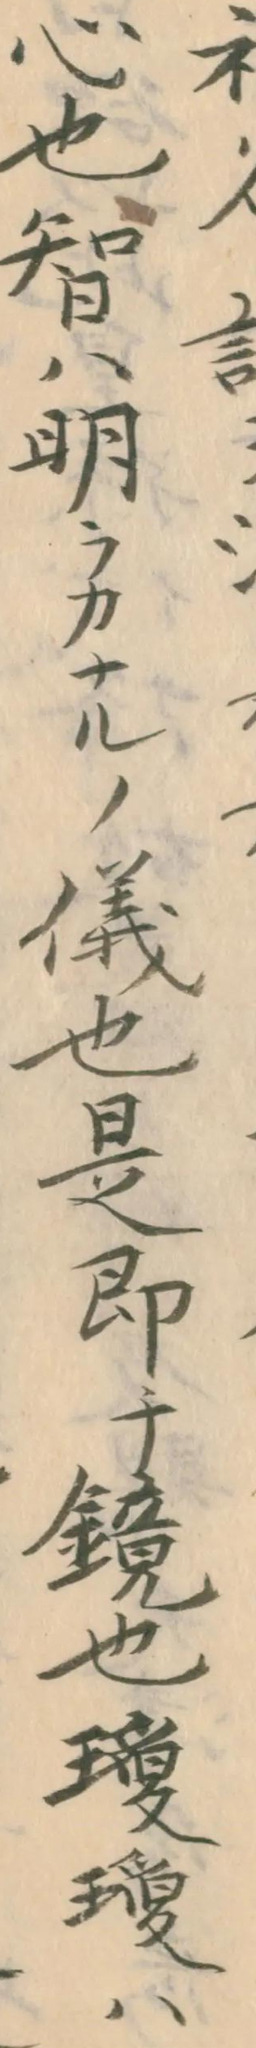心也智ハ明ラカナルノ儀也是即チ鏡也瓊瓊ハ
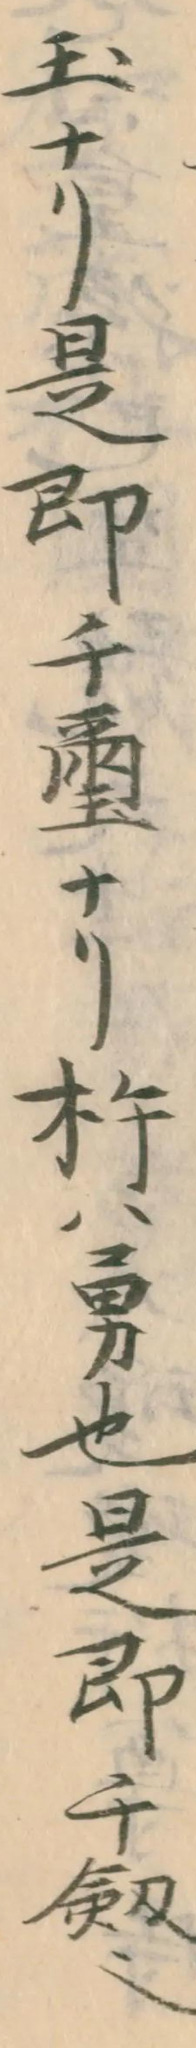玉ナリ是即千璽ナリ杵ハ勇也是即チ剣也
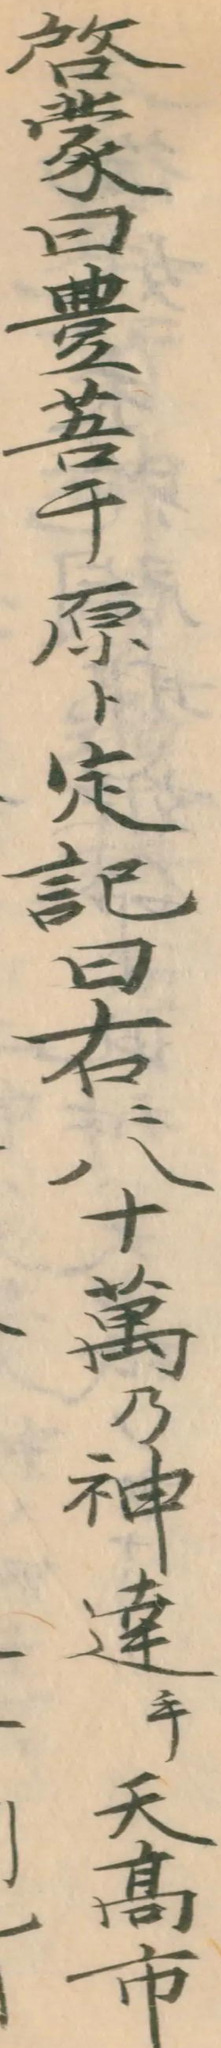啓蒙曰豊葦原ト定記曰右ニ八十萬乃神達手天高市
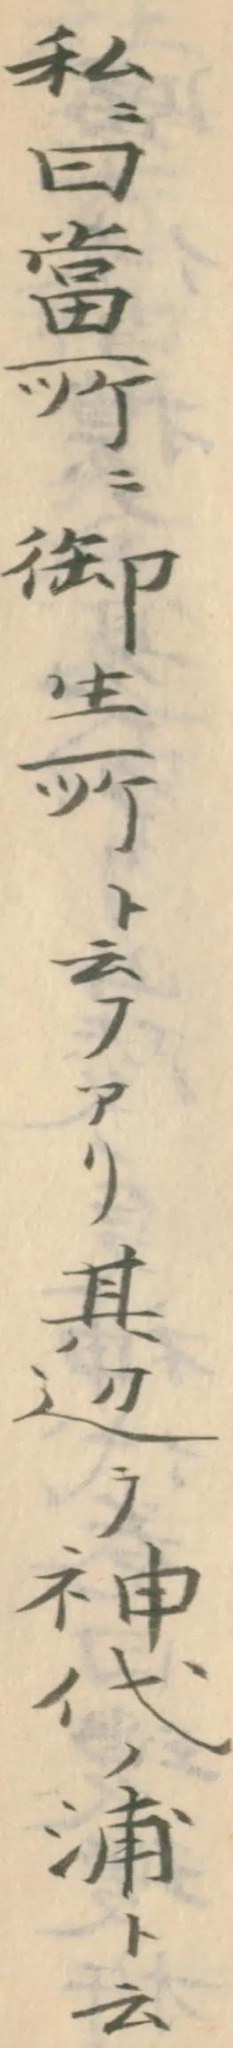私ニ曰当所ニ御生所ト云フアリ其辺ノ神代ノ浦ト云
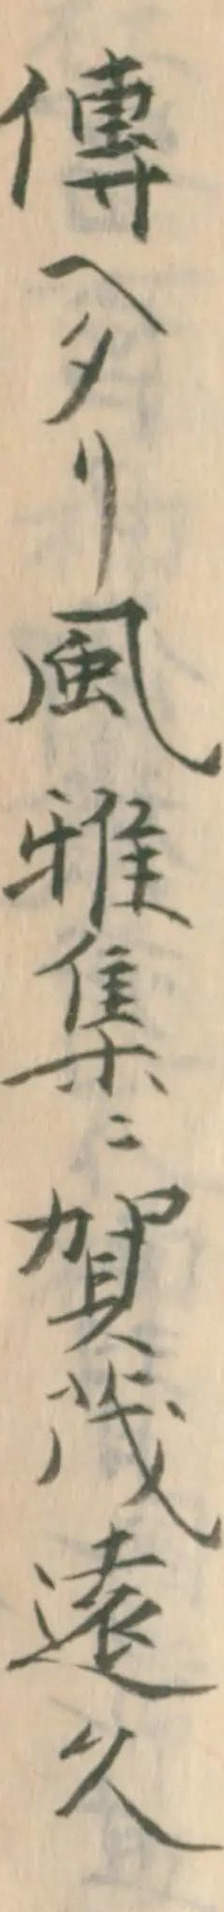伝ヘタリ風雅集ニ賀茂遠久
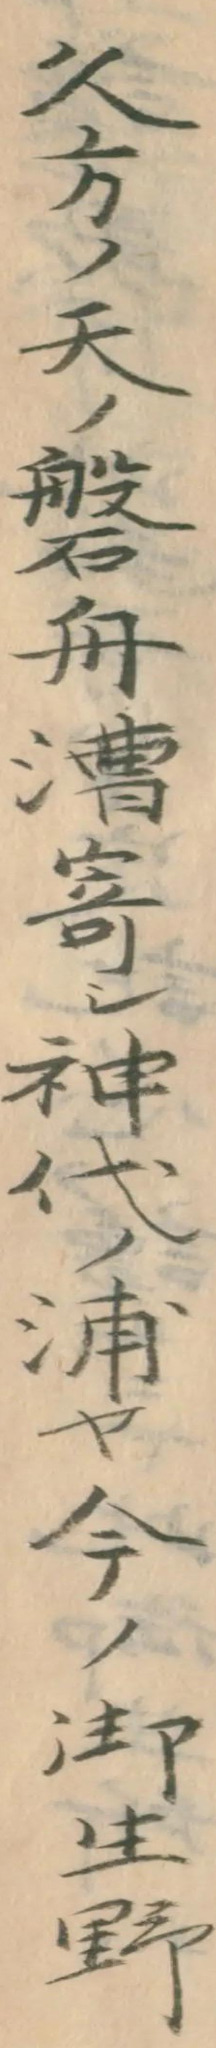久方ノ天ノ磐舟漕寄シ神代ノ浦ヤ今ノ御生野

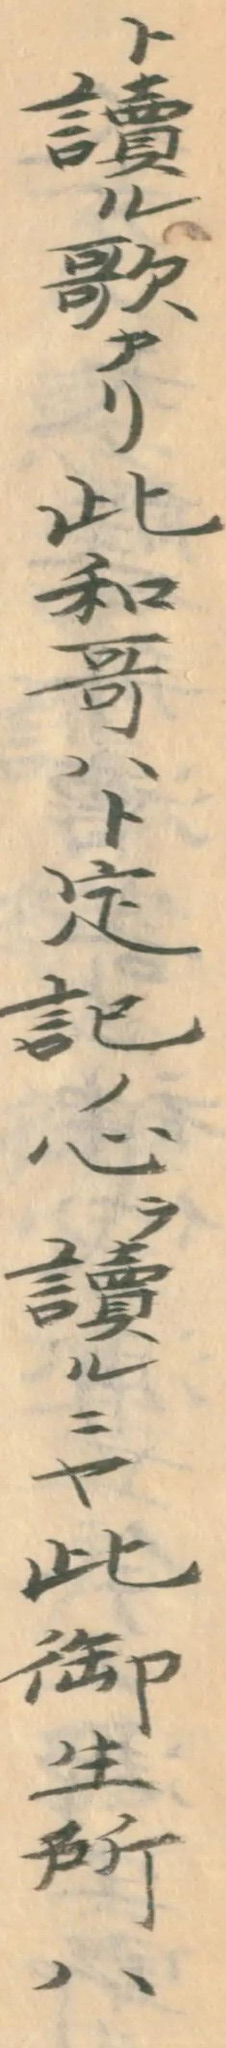ト読ル歌アリ此和哥ハト定記ノ心ヲ読ルニヤ此御生所ハ
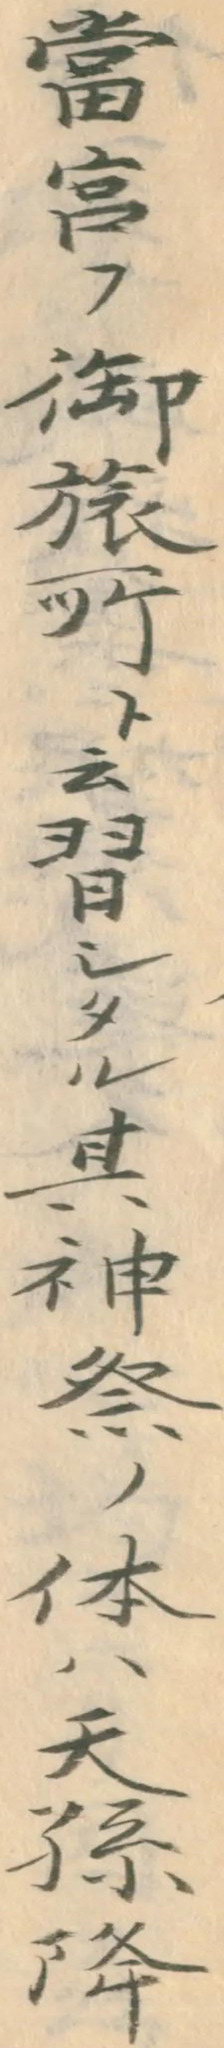当宮フ御旅所ト云習シタル其神祭ノ体ハ天孫降
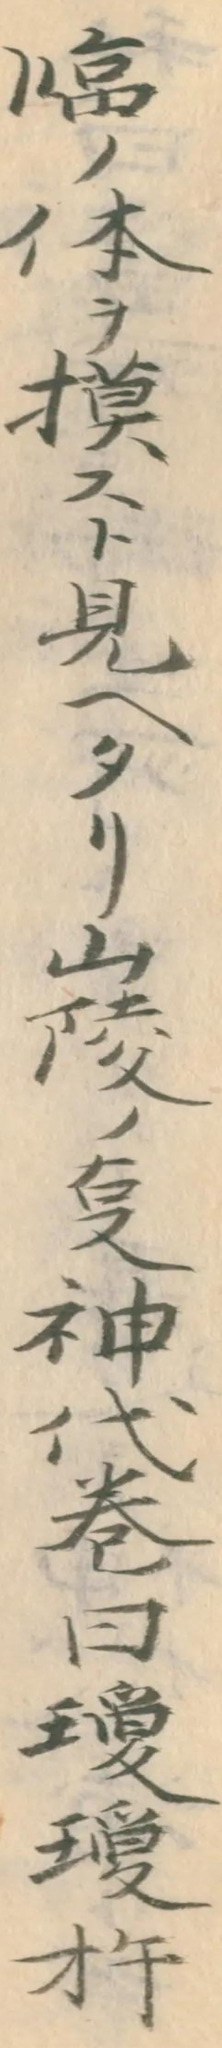臨ノ体ヲ摸スト見ヘタリ山陵ノ事神代巻曰瓊瓊杵
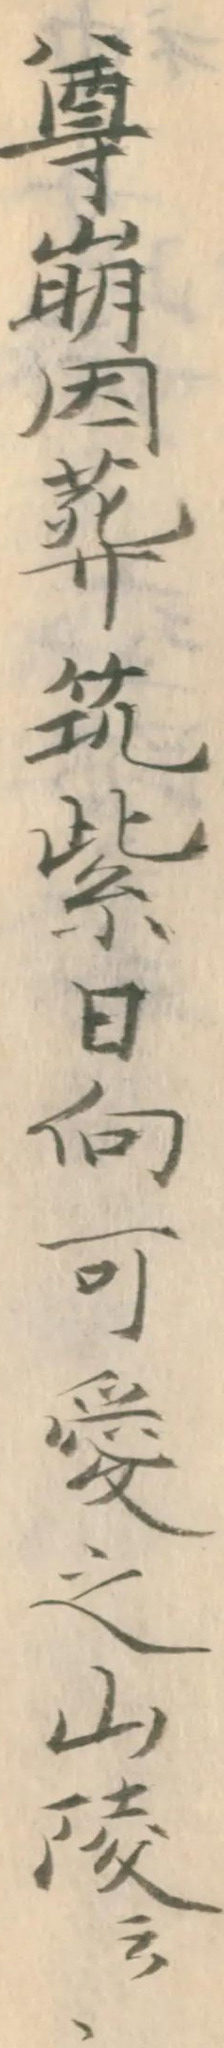尊崩因葬筑紫日向可愛之山陵云々
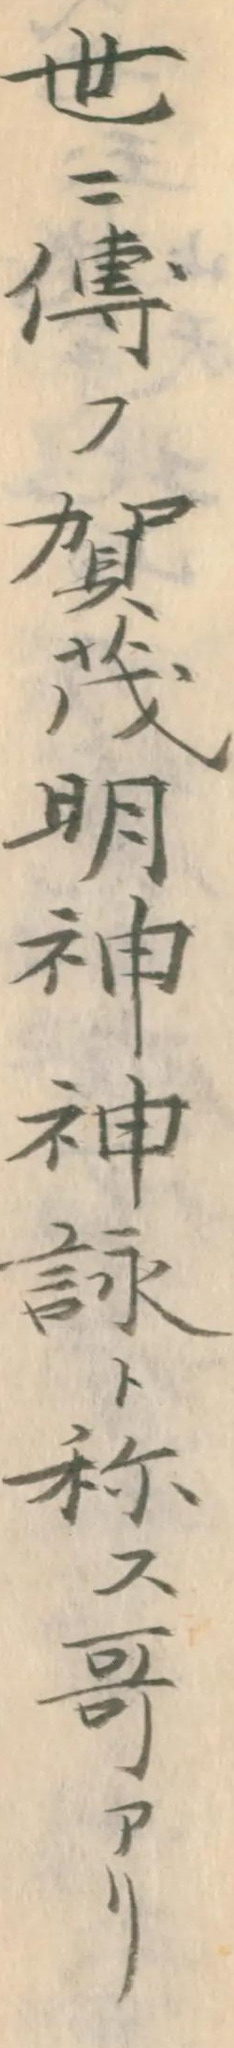世ニ伝フ賀茂明神神詠ト称ス哥アリ
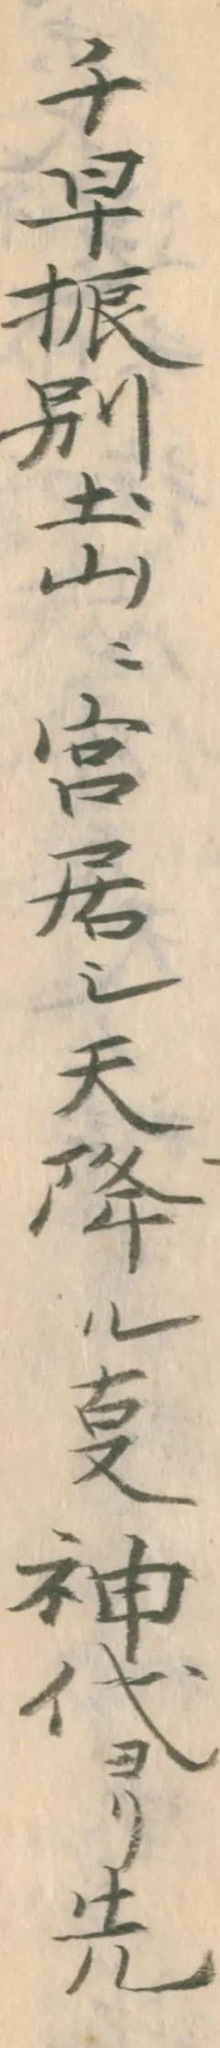千早振別土山ニ宮居シ天降ル事神代ヨリ先
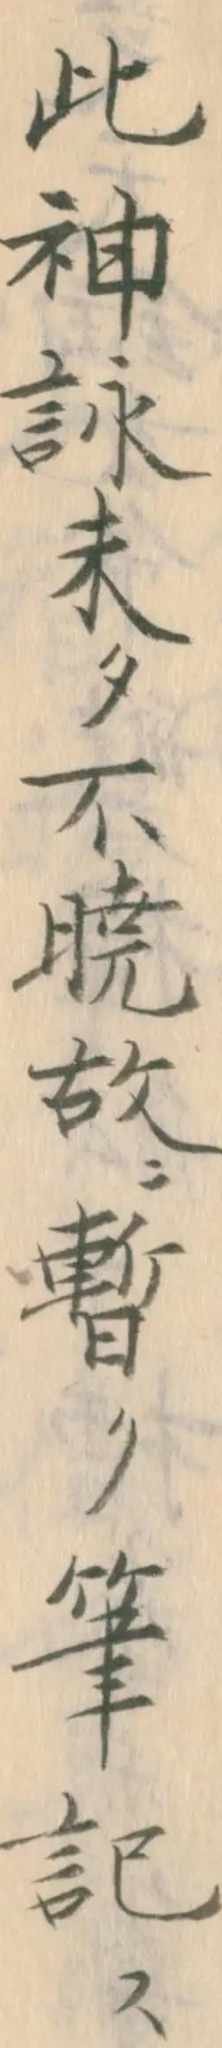此神詠未タ不暁故ニ暫ク筆記ス
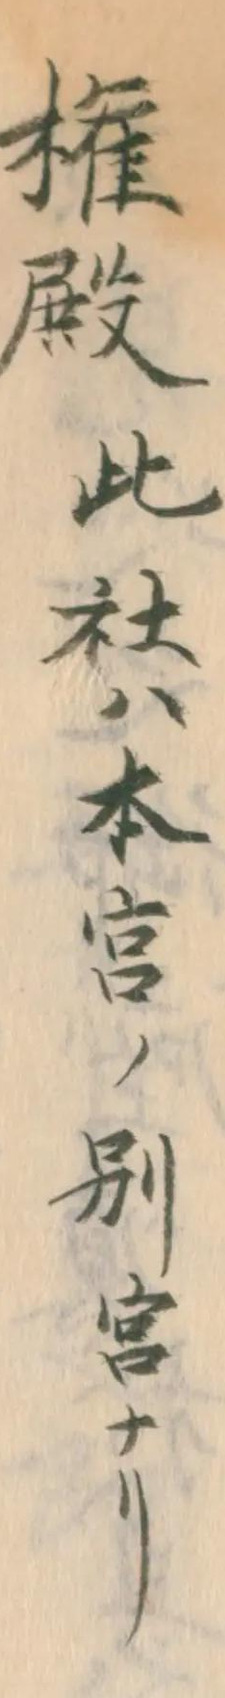権殿此社ハ本宮ノ別宮ナリ
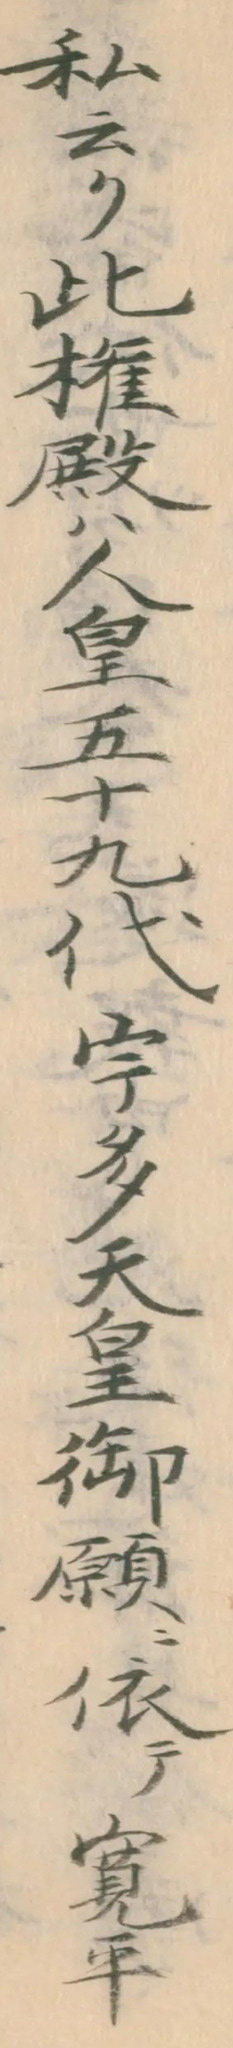私云ク此権殿ハ人皇五十九代宇多天皇御願ニ依テ寛平
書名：賀茂社記録. 第91冊
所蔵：国立国会図書館 National Diet Library, JAPAN
